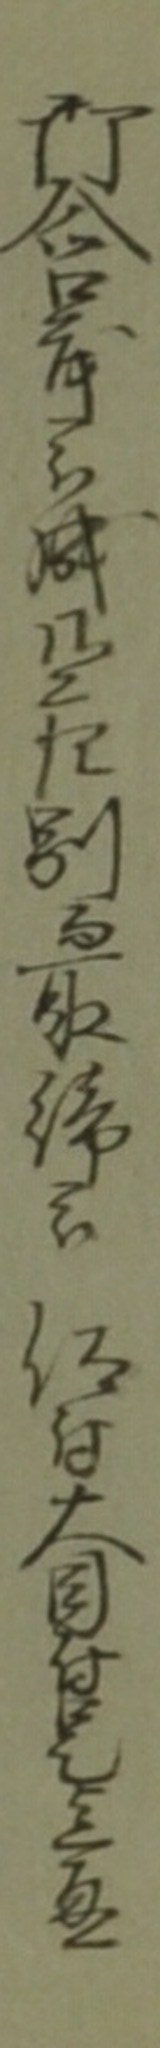御含茂被成御座別而取締被仰付大目付是迄通
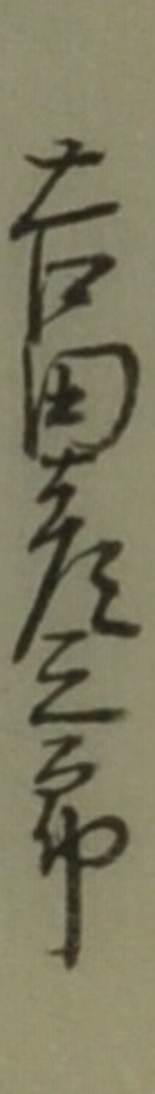吉田彦三郎
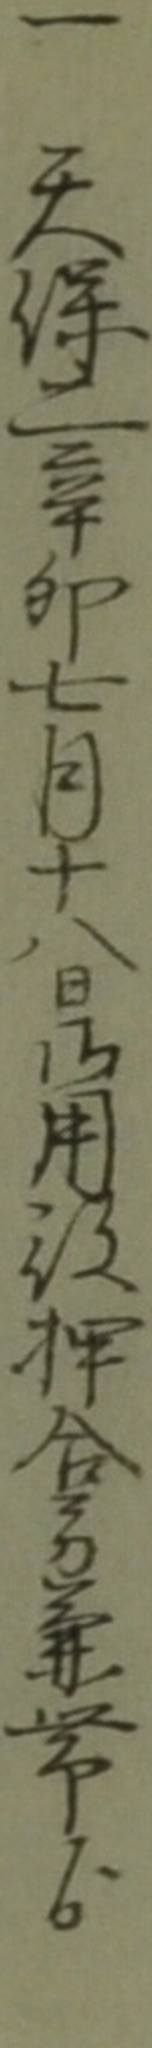一天保ニ辛卯七月十八日町御用役押合方兼帯ゟ
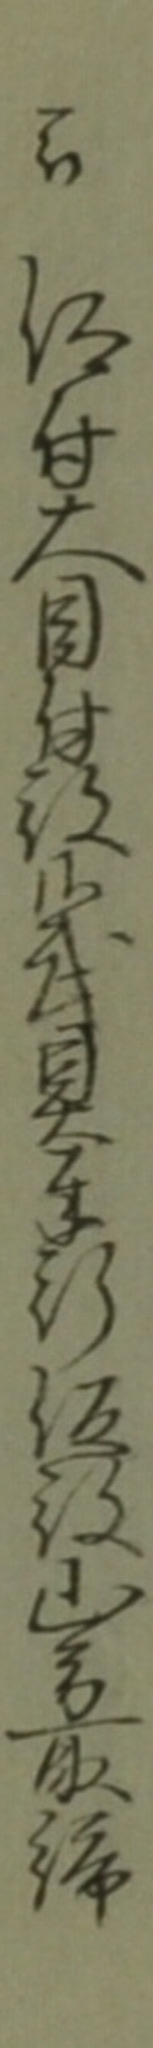被仰付大目付役御武具奉行仮役山方取締
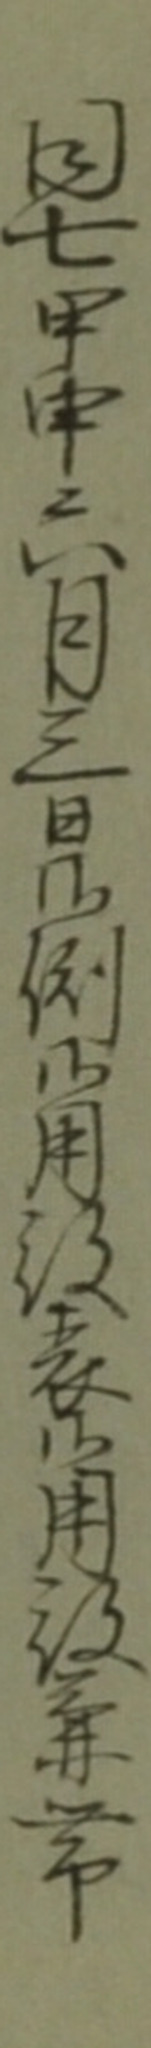一同七甲申六月三日御側御用役表御用役兼帯
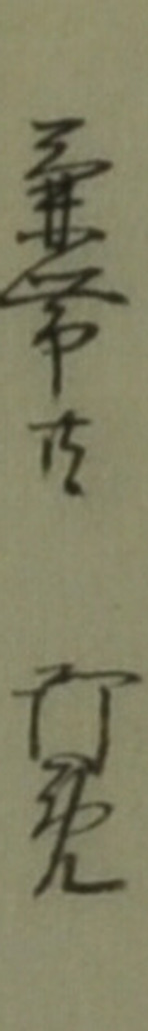兼帯共御免
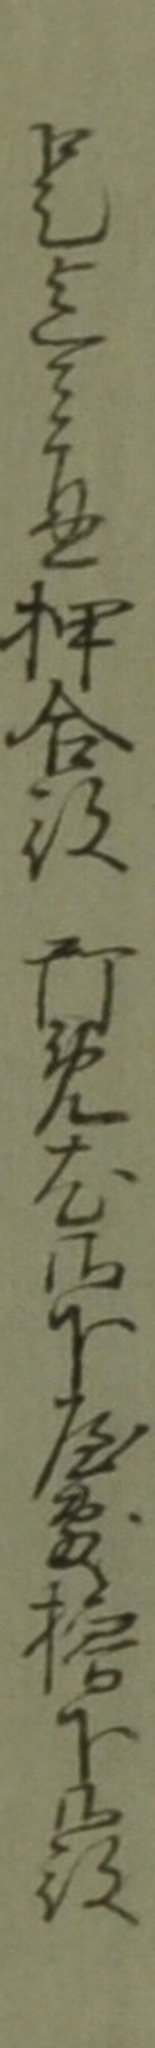是迄之通押合役御免尤御下屋敷櫓下御役
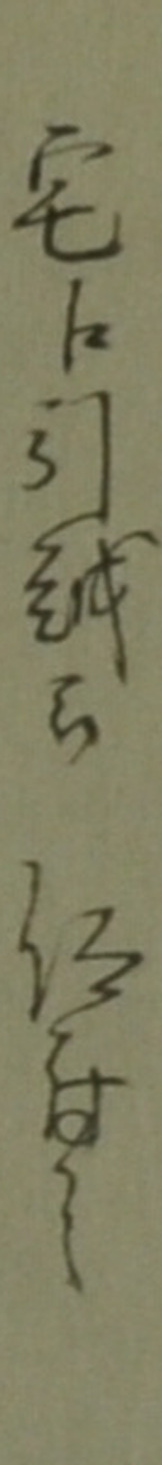宅江引越被仰付之
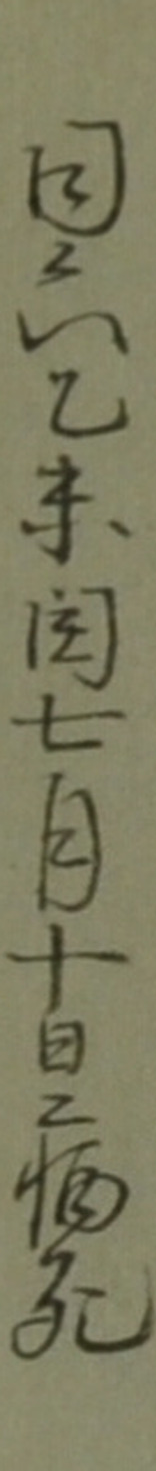一同六乙未閏七月十日病死
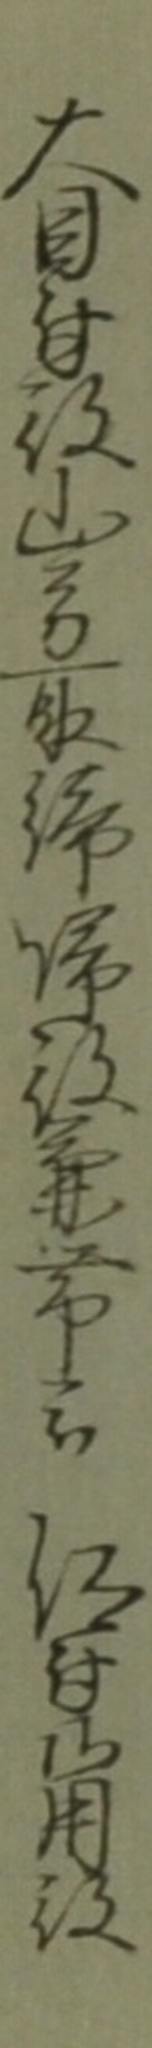大目付役山方取締帰役兼帯被仰付御用役
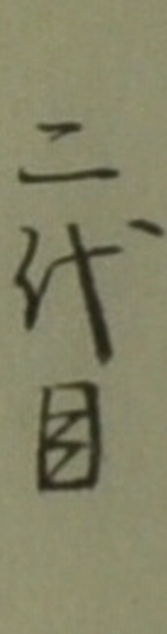二代目
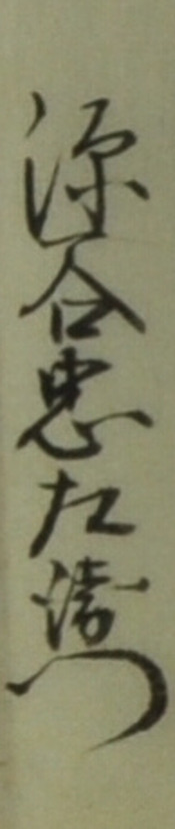源谷忠左衛門

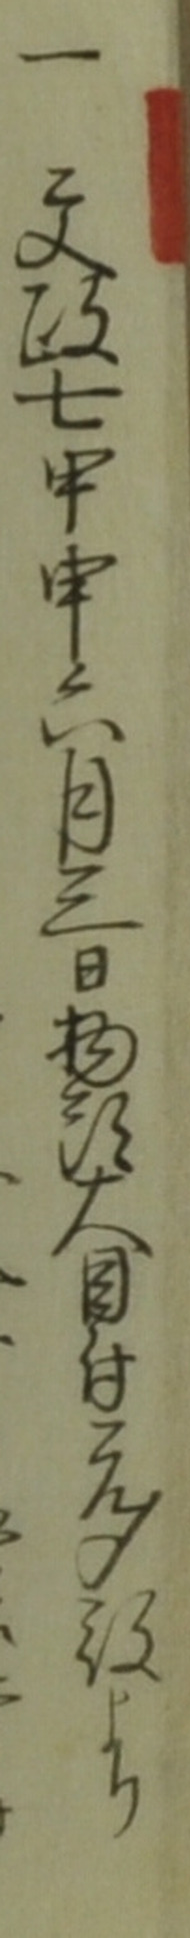一文政七甲申六月三日物頭大目付元〆役より
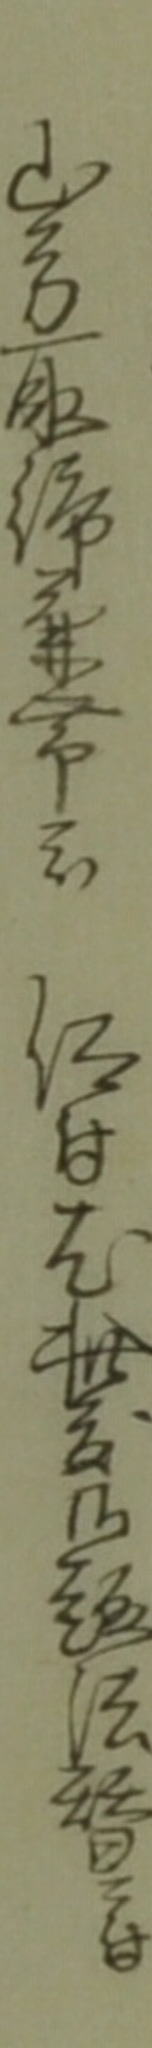山方取締兼帯被仰付尤此度御趣法替ニ付
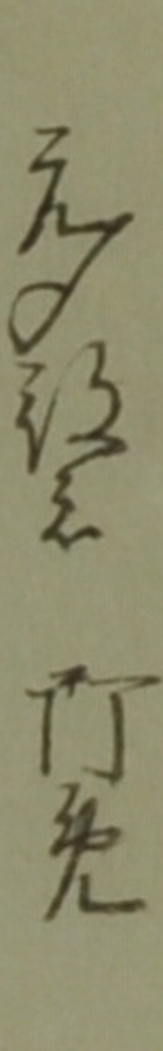元〆役者御免
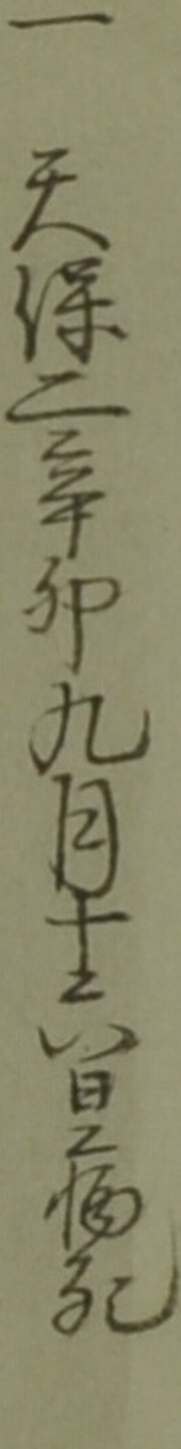天保二辛卯九月十六日病死
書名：諸御役代々録（三）
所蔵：伊那市立高遠町図書館・合同会社AMANE
